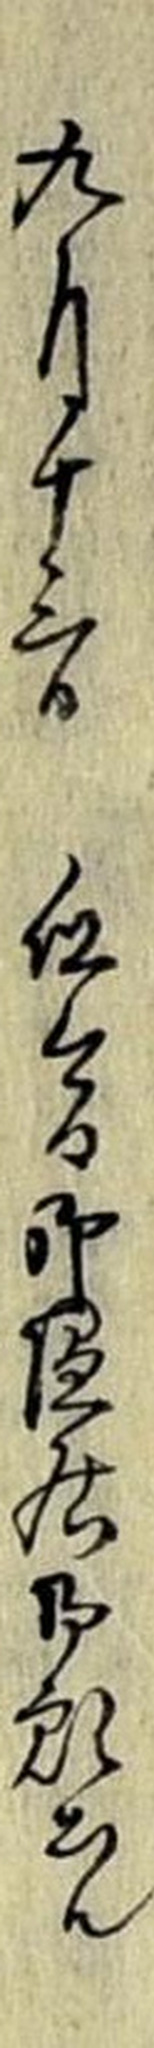九月十三日但今日御隠居御願出ル
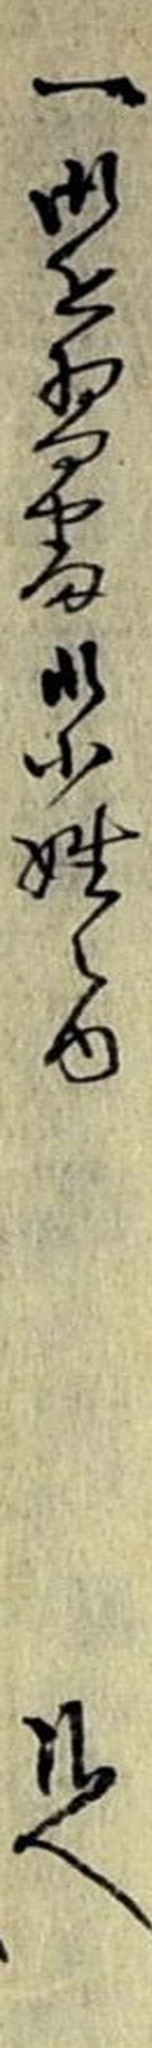一御近習番御小姓之内弐人
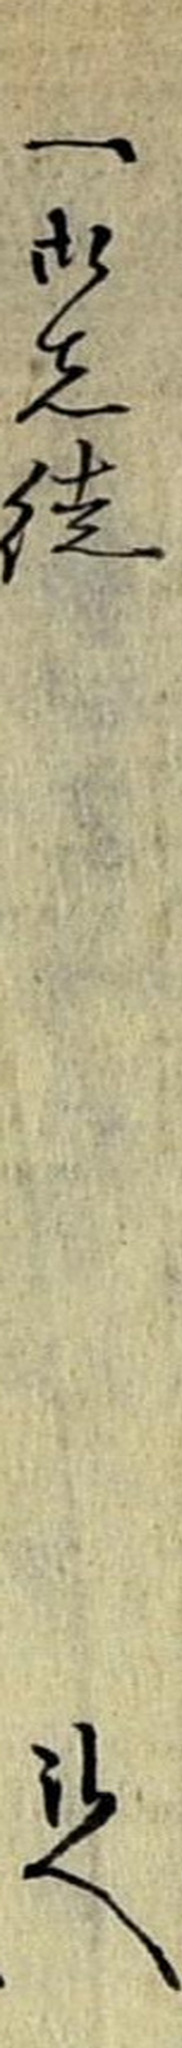一御先徒弐人
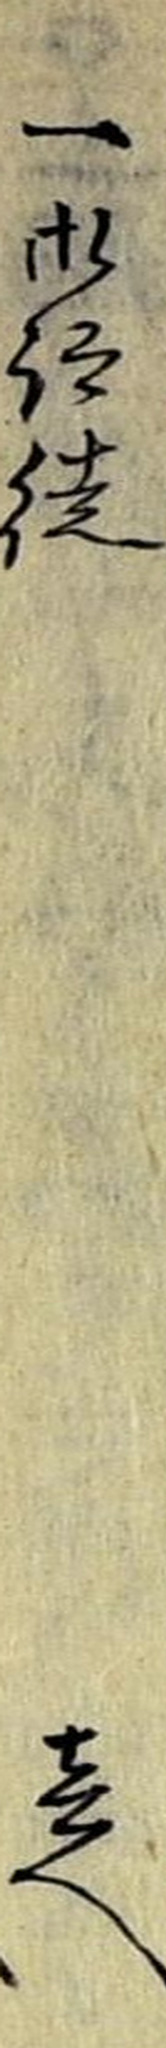一御跡徒壱人
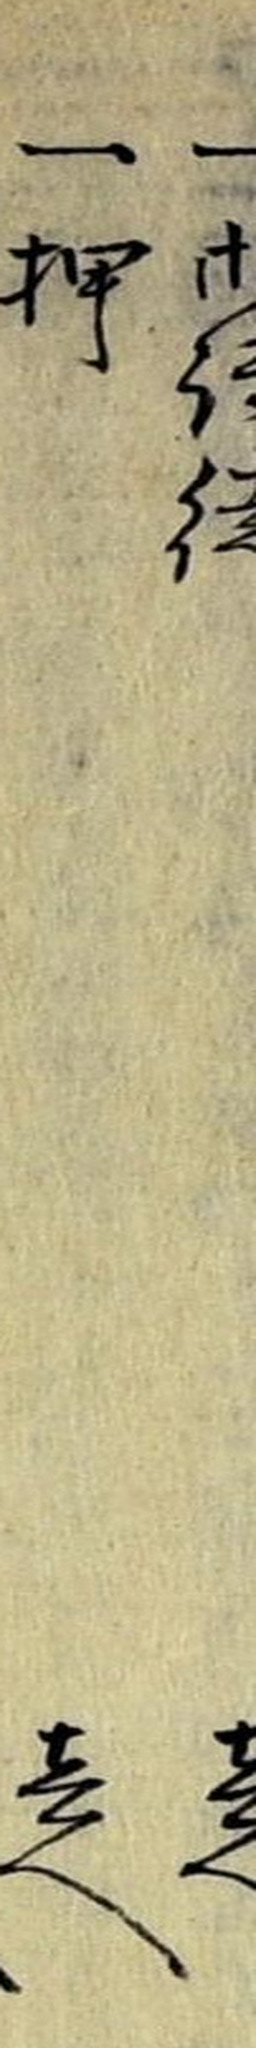一押壱人
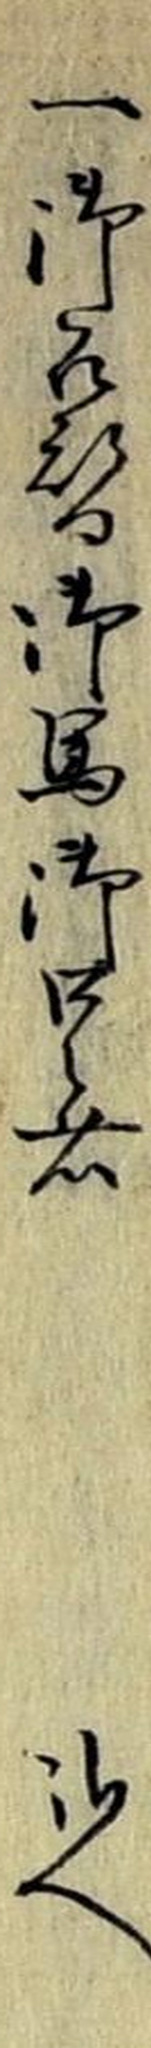一御召替御馬御口之者弐人
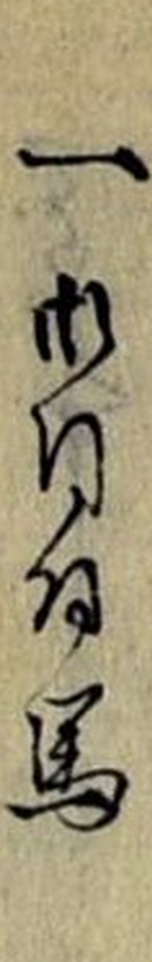一御目付馬
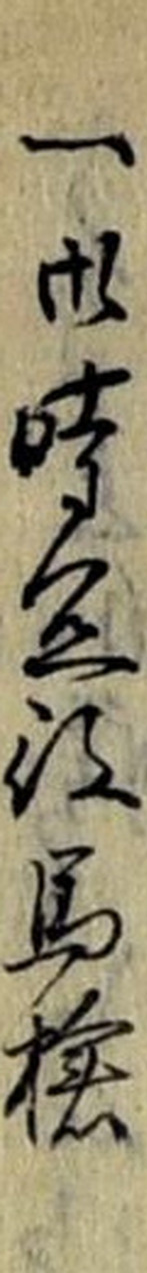一御時宜役馬槍
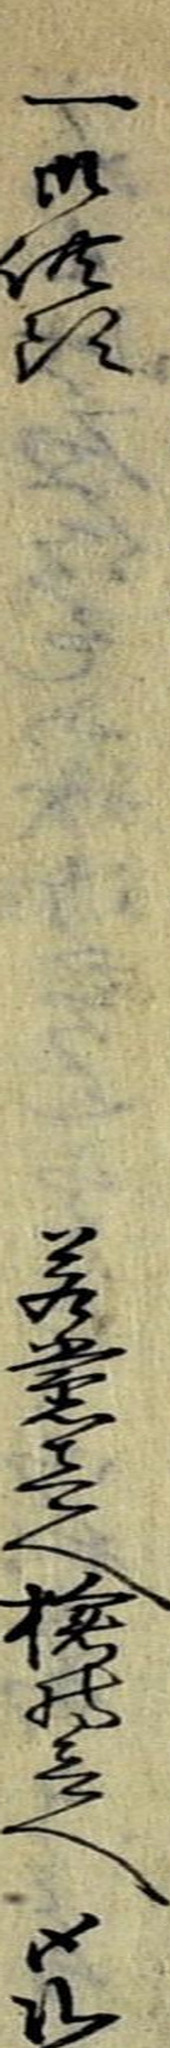一御供頭若党壱人槍持壱人
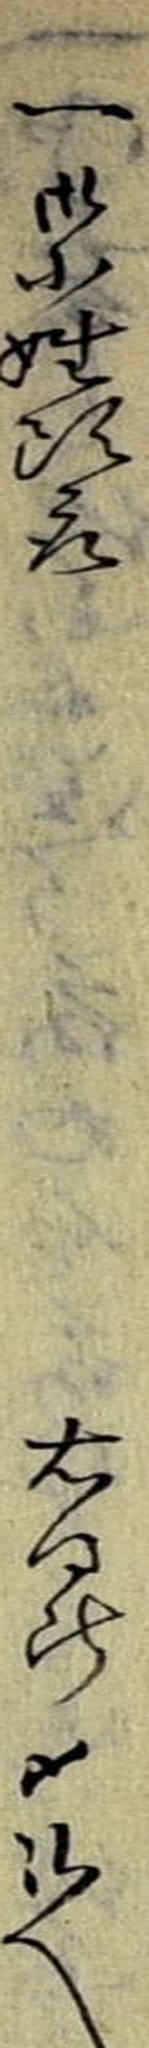一御小姓頭取右同断〆弐人
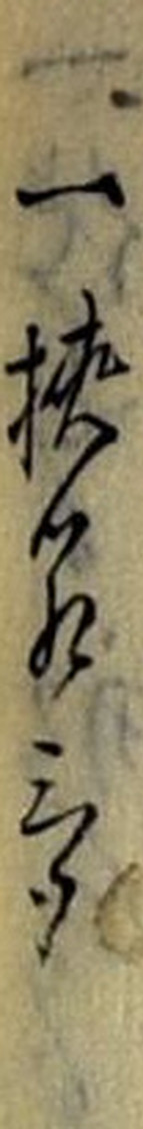一挟箱三ツ三人
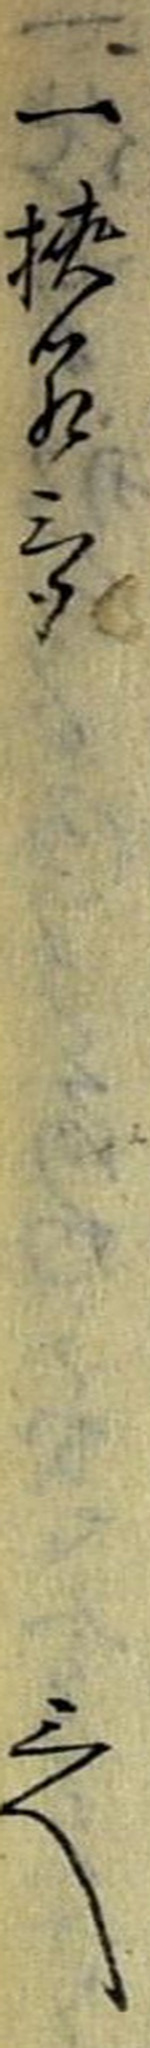一挟箱三ツ三人
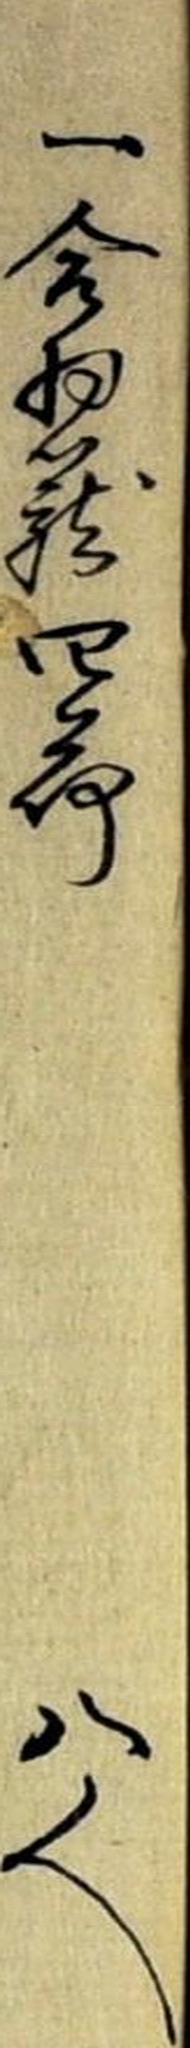一合羽籠四荷八人
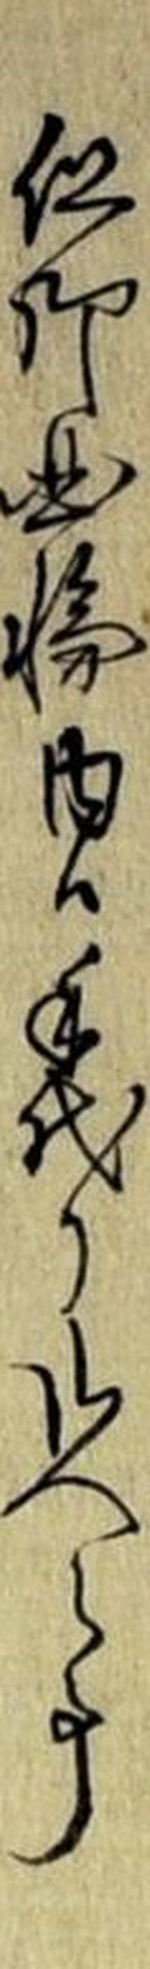但御曲輪内ハ手代り弐人之事
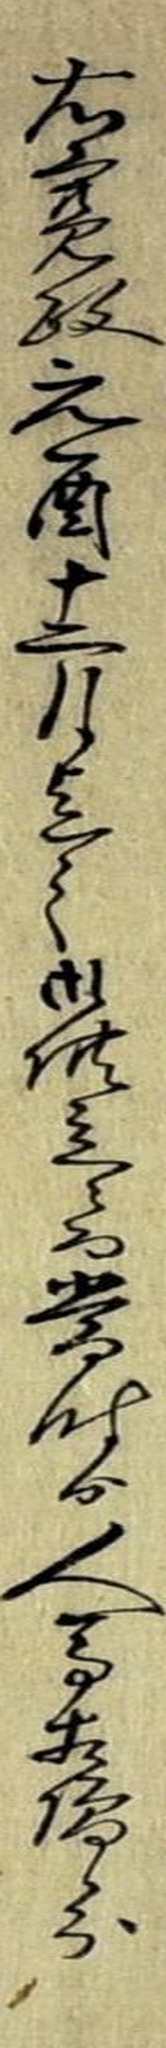右寛政元酉十二月迄之御供立ニ而当時ゟ人馬相増候分
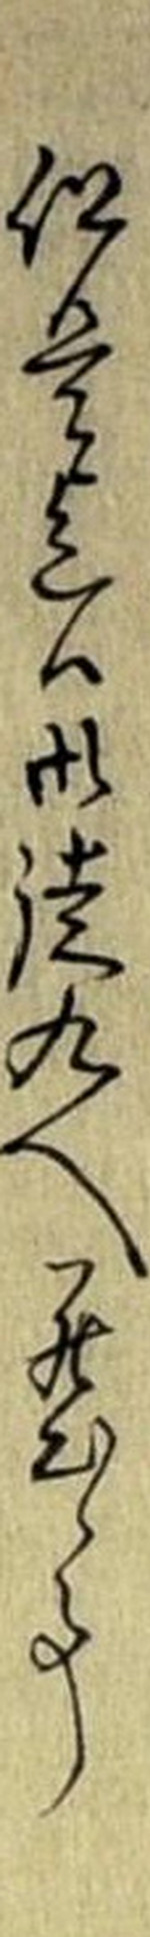但是迄ハ御徒九人罷出候事
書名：命令之部 三
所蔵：福井県文書館 Fukui Prefectural Archives
